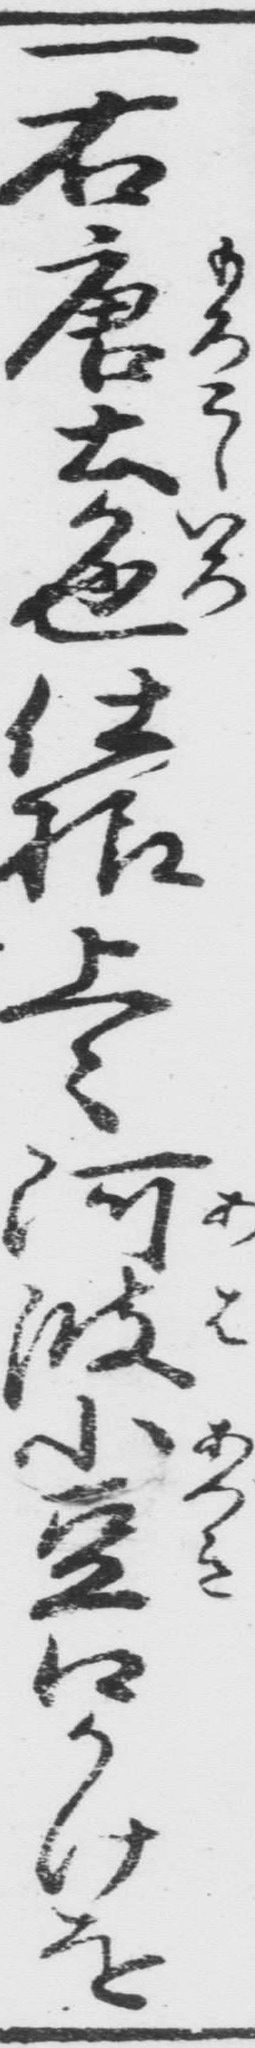一右唐土色仕様上々阿波小豆口かけを
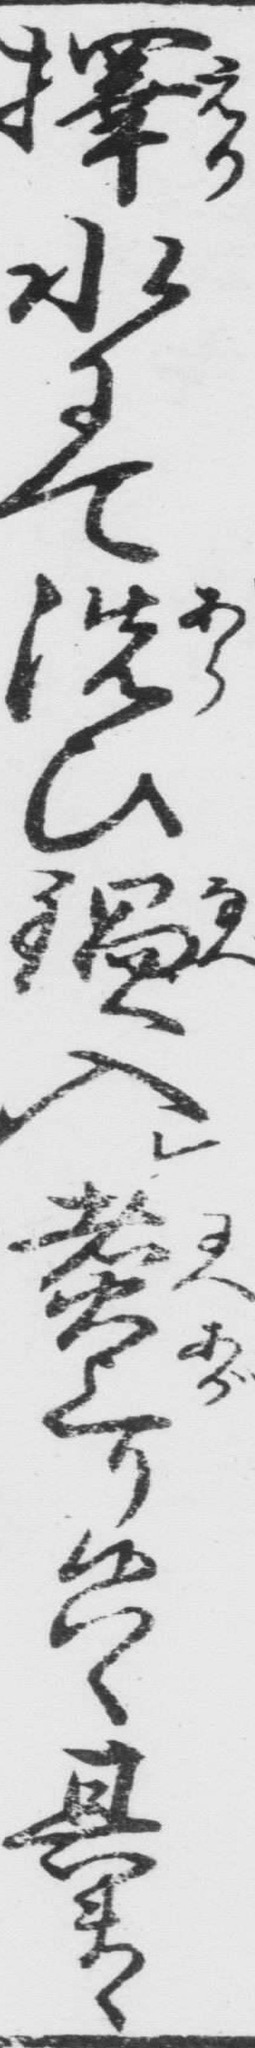択水にて洗ひ鍋へ入れ煮上り候はゝ其まゝ
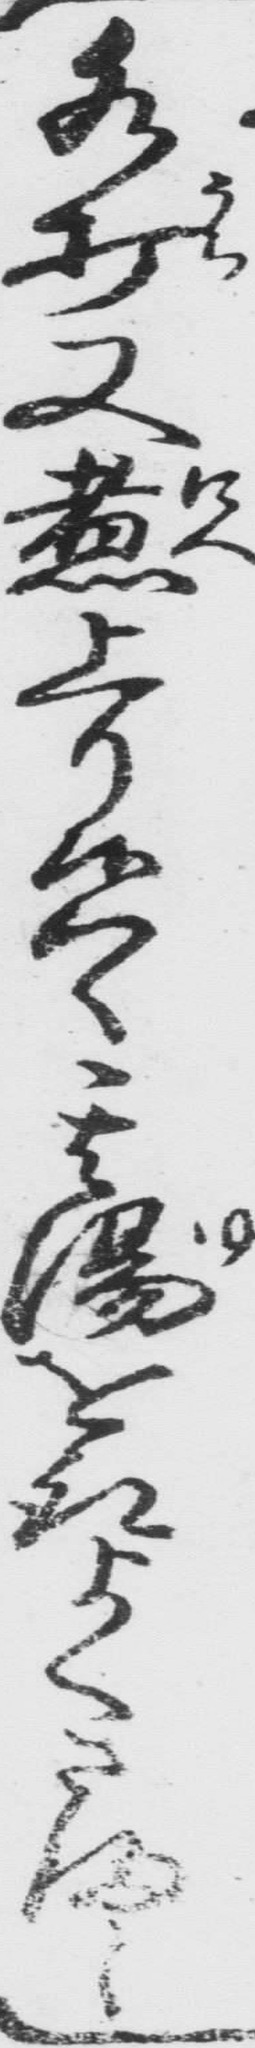水打又煮上り候はゝ其湯を取よくさまし

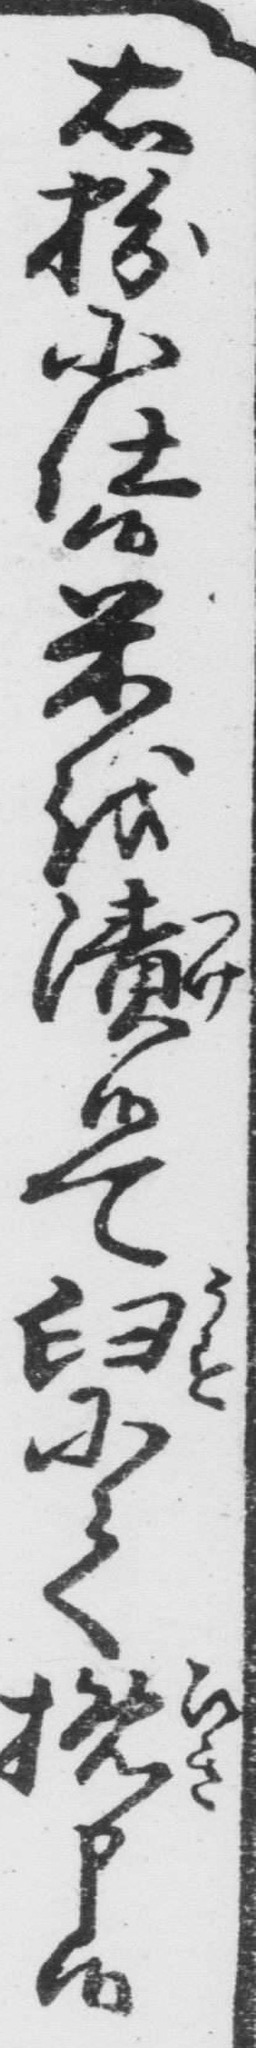右粉に仕候米を漬候て臼にて挽申候
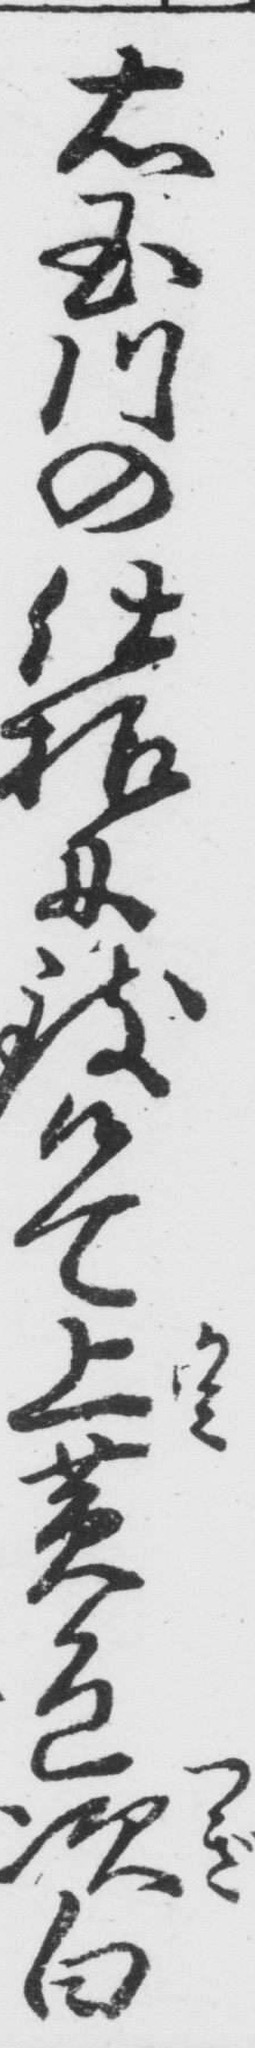右玉川の仕様に致候て上黄色次白
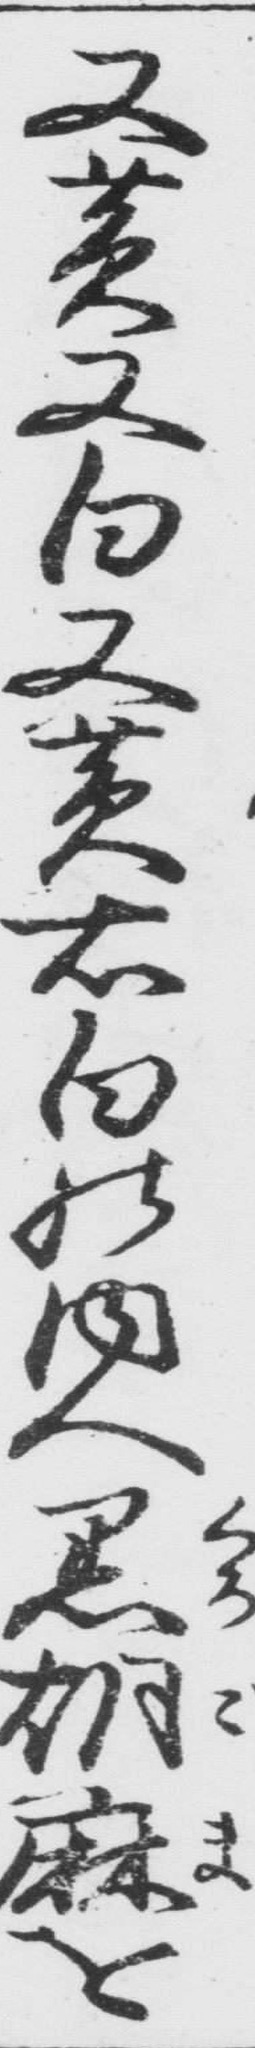又黄又白又黄右白の内へ黒胡麻を
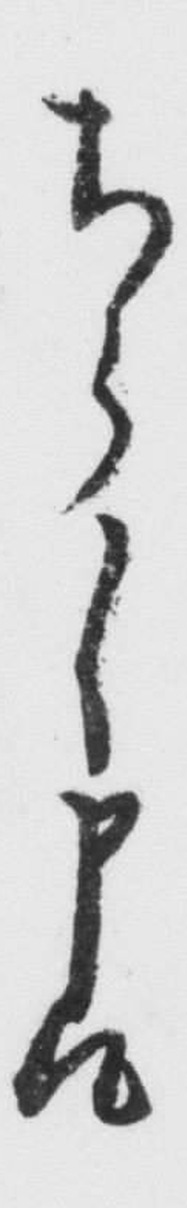ちらし申候
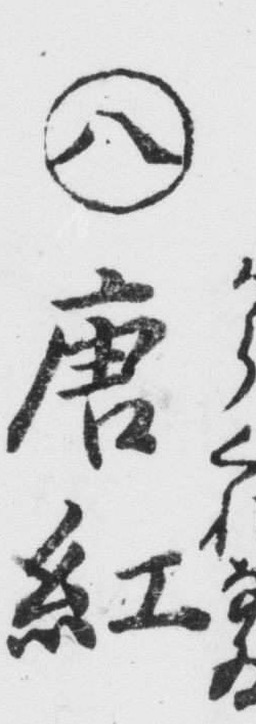(八)唐紅
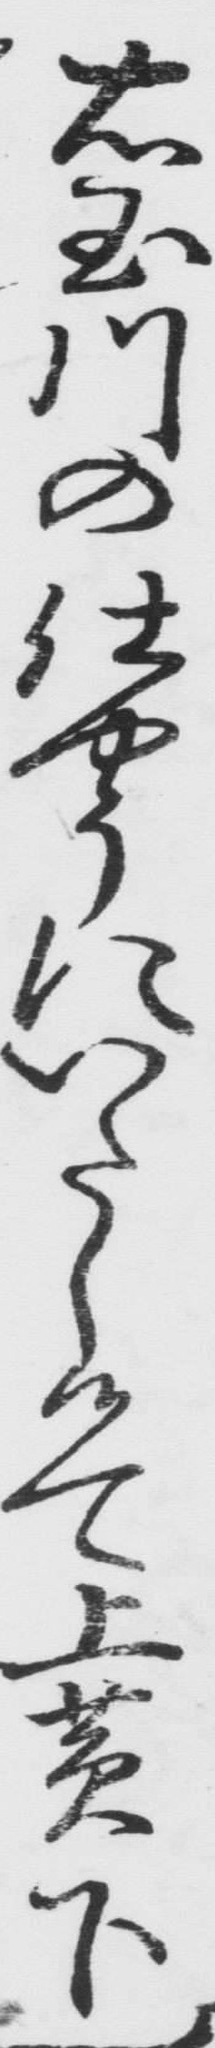右玉川の仕やうにいたし候て上黄下
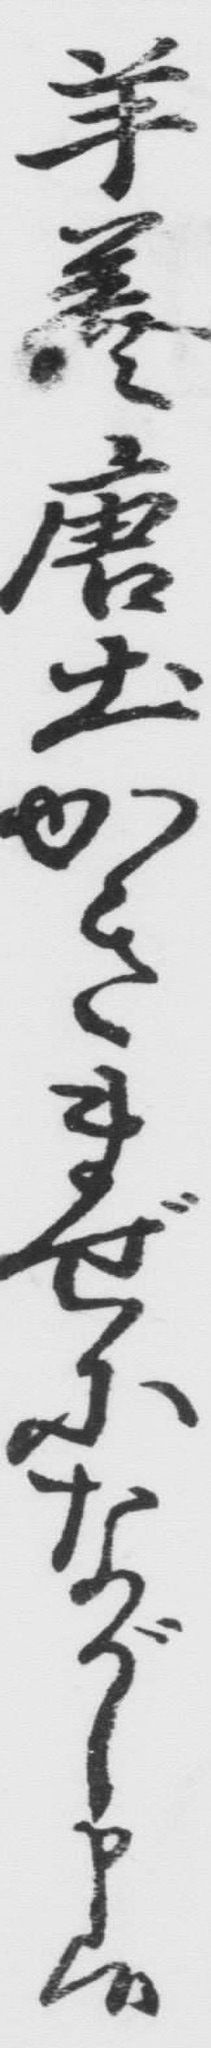羊羹唐土かきまぜにながし申候
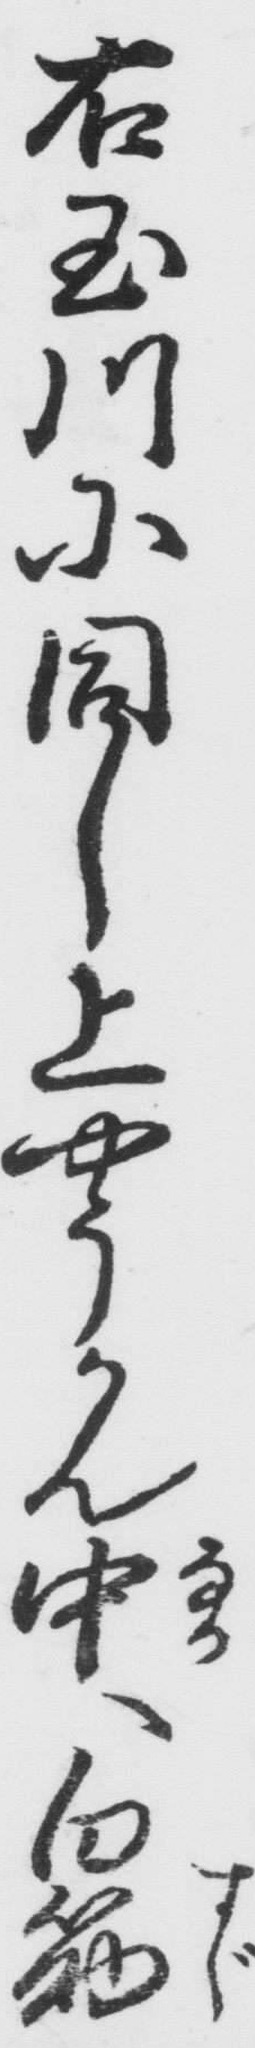右玉川に同し上やうかん中へ白筋

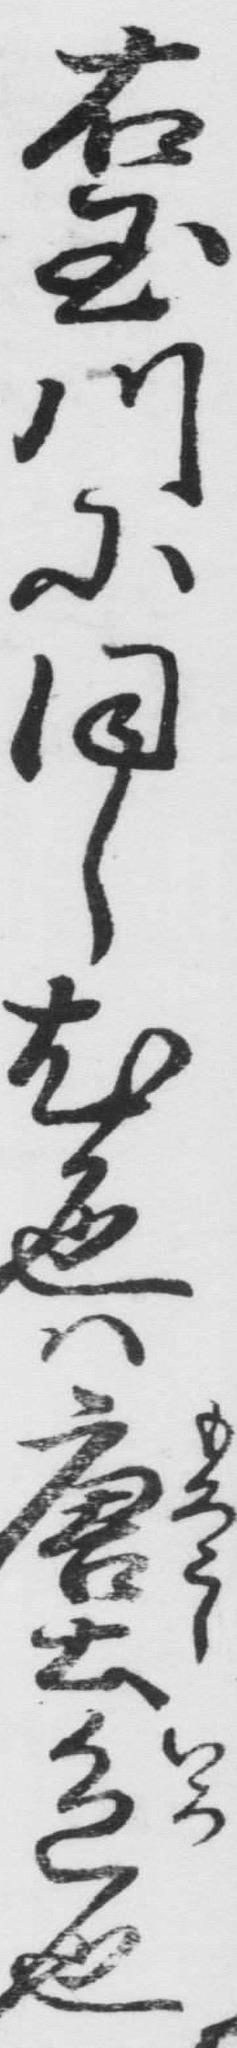右玉川に同し尤色は唐土色也
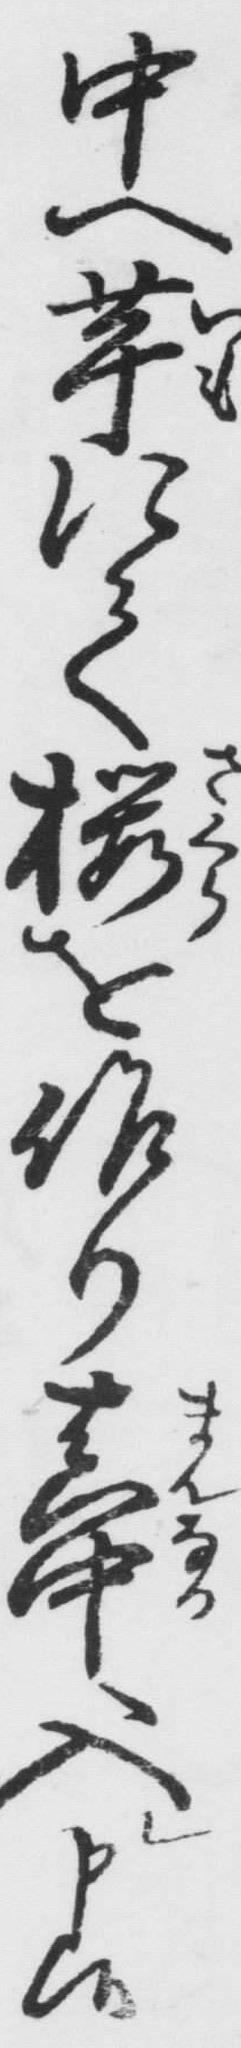中へ芋にて桜を作り真中へ入れ申候
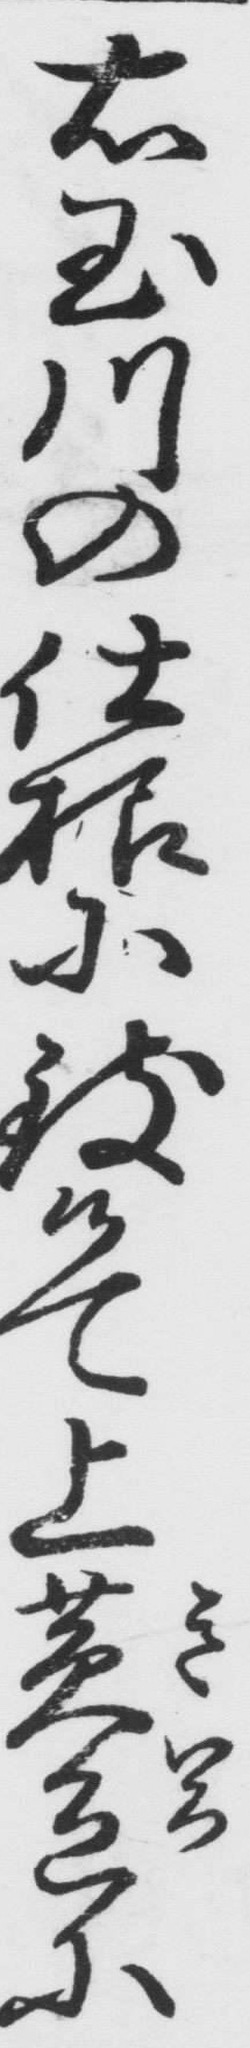右玉川の仕様に致候て上黄色に
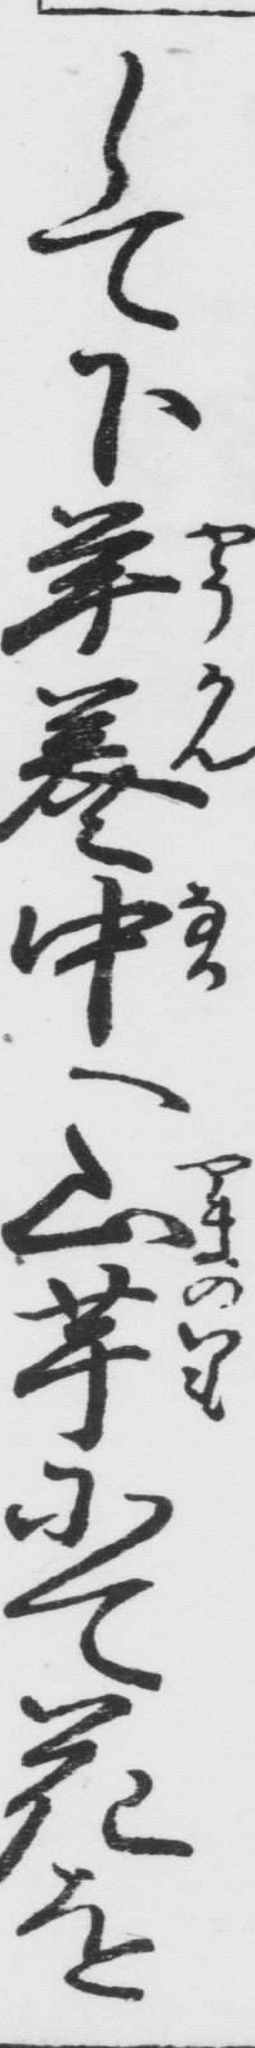して下羊羹中へ山芋にて花を
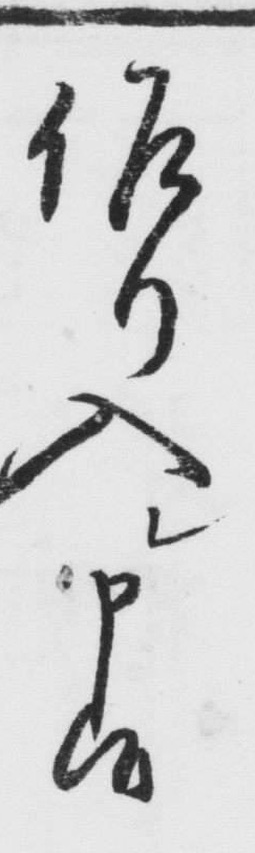作り入れ申候
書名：御前菓子図式
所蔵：大阪府立大学学術情報センター 国文学研究資料館
